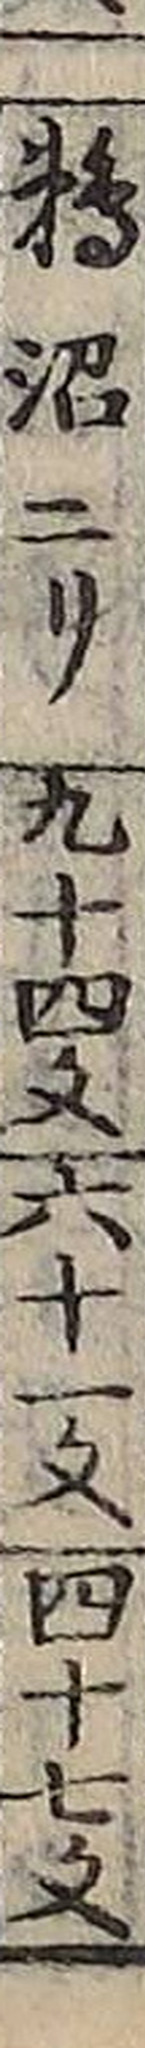鵜沼二リ九十四文六十一文四十七文
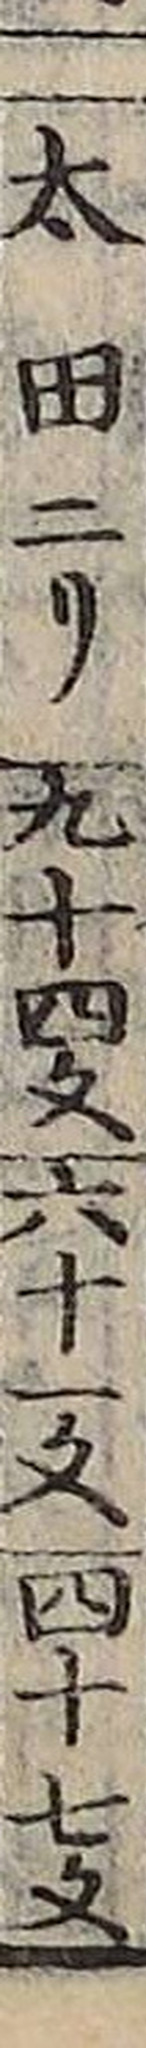太田二リ九十四文六十一文四十七文
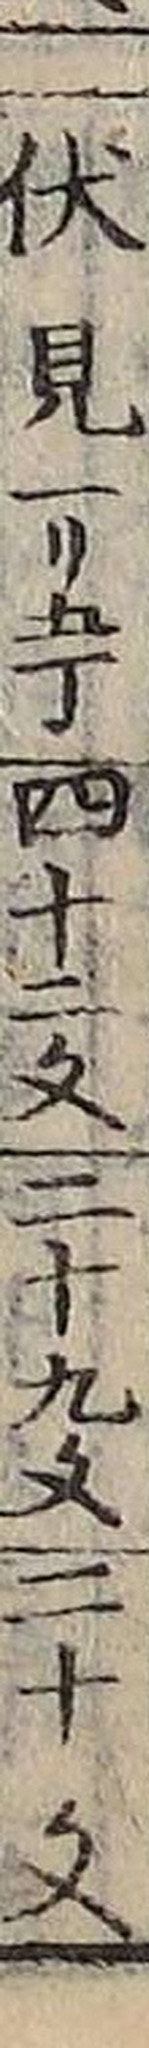伏見一リ五丁四十二文二十九文二十文
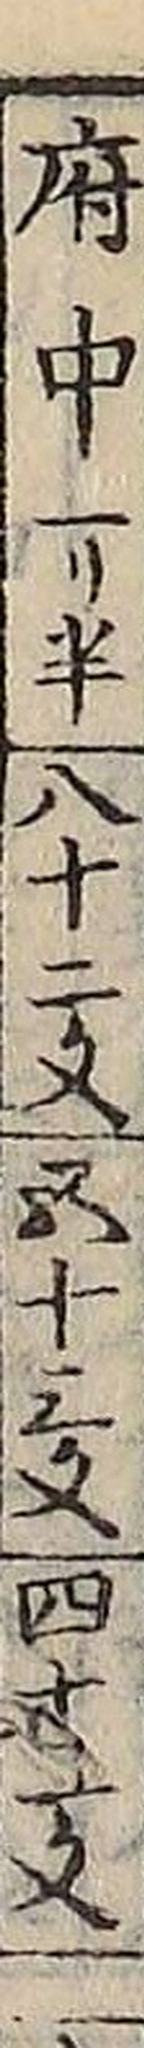府中一リ半八十二文五十三文四十一文
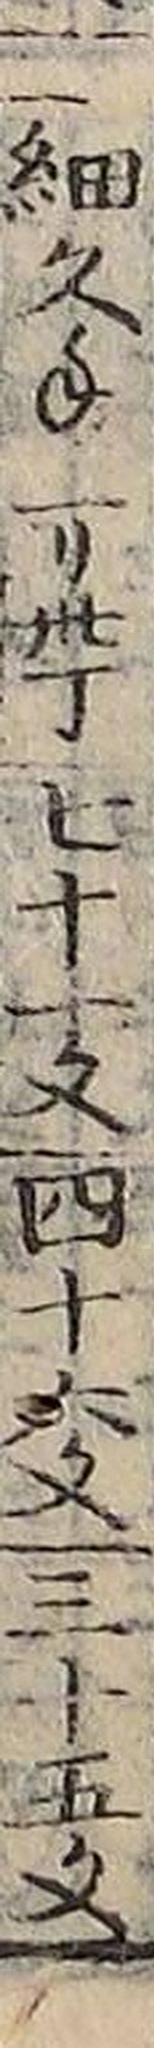細久手一リ卅丁七十一文四十六文三十五文
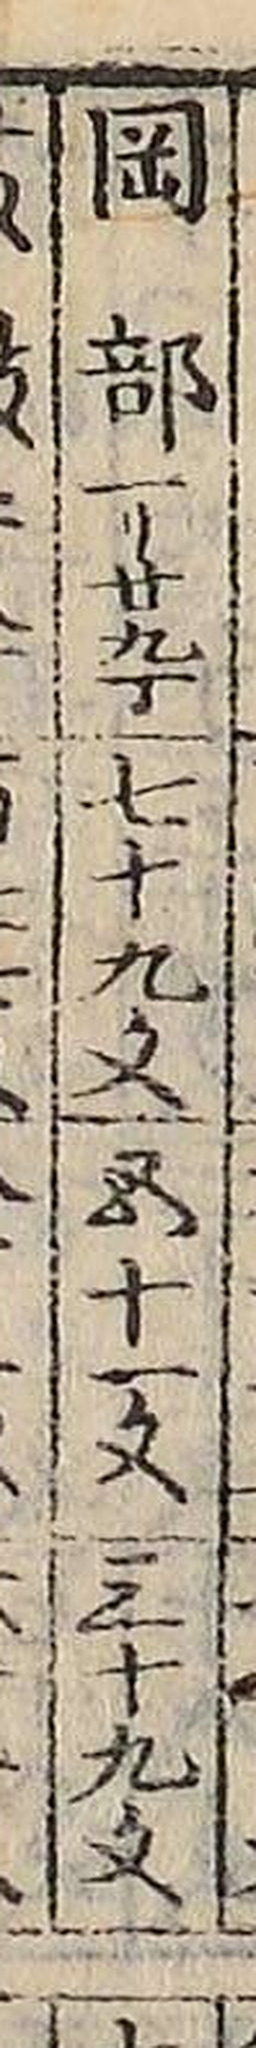岡部一リ廿九丁七十九文五十一文三十九文
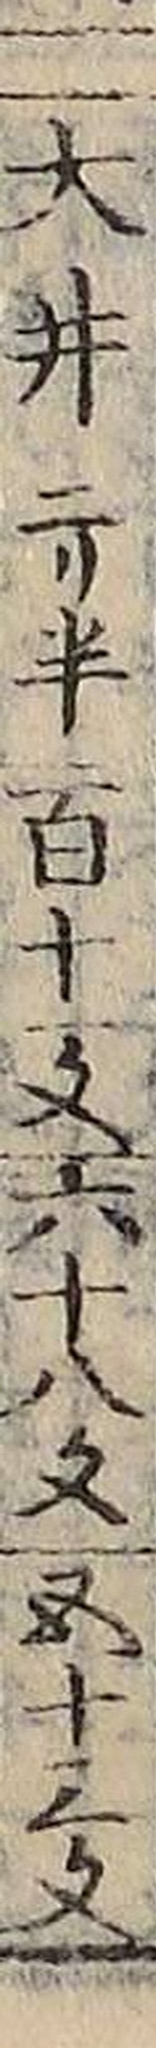大井二リ半百十一文六十八文五十三文
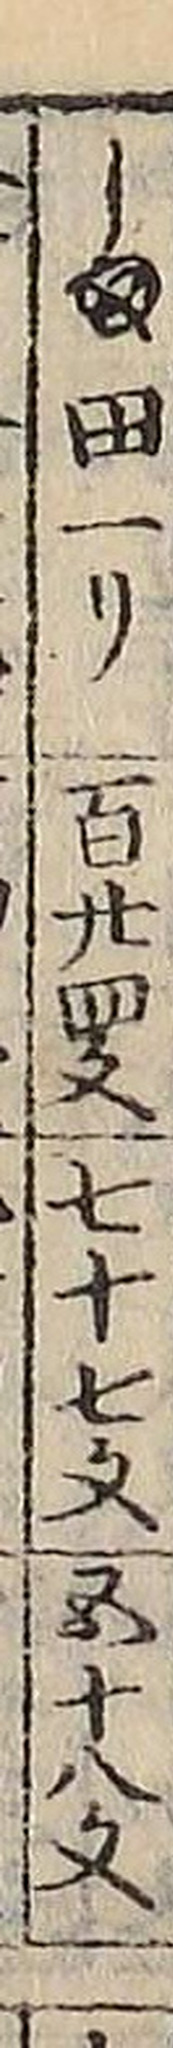しま田一リ百廿四文七十七文五十八文
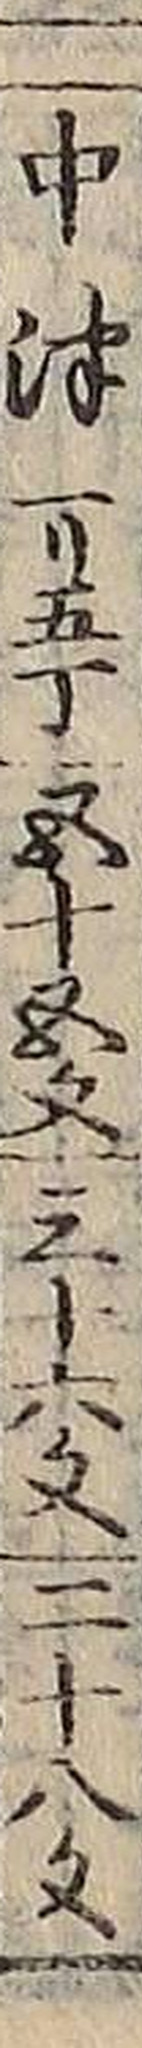中津一リ五丁五十五文三十六文二十八文
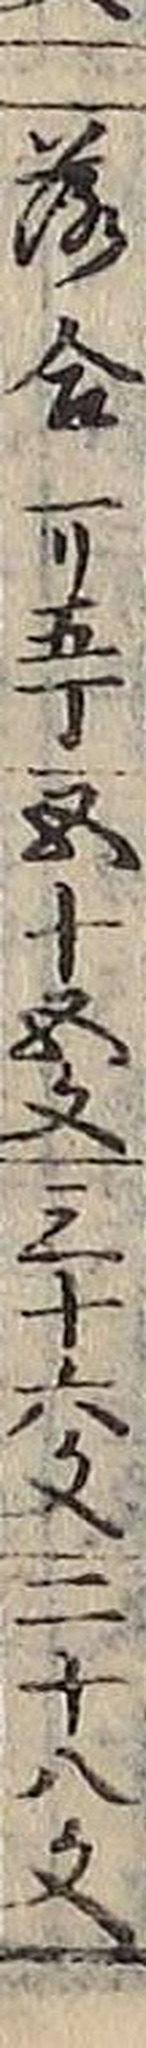落合一リ五丁五十五文三十六文二十八文
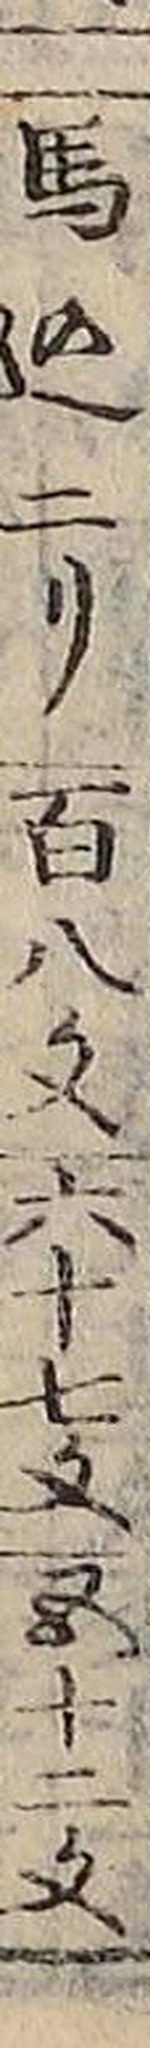馬込二リ百八文六十七文五十二文
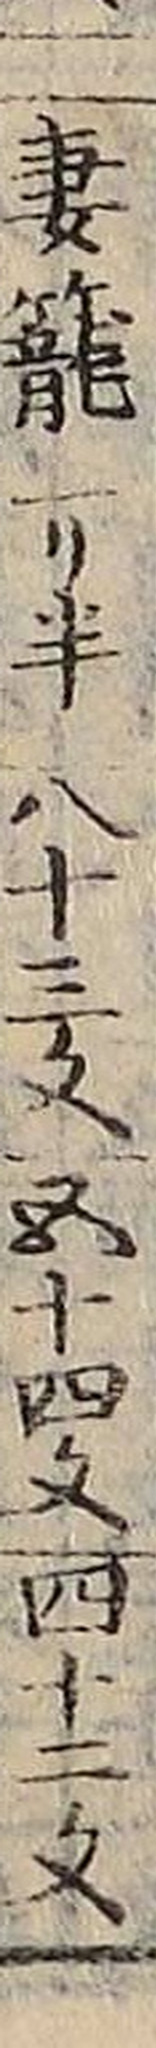妻篭一リ半八十三文五十四文四十二文
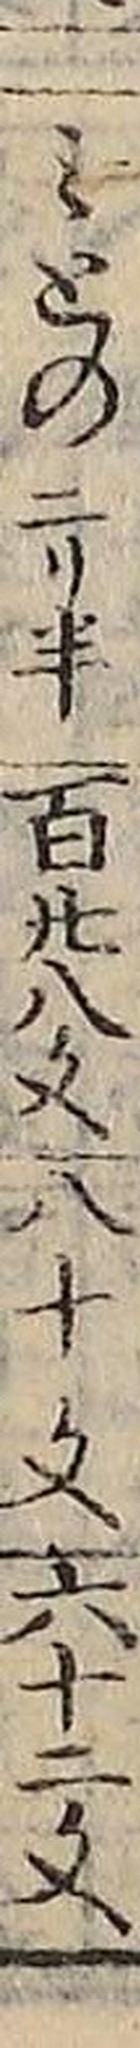みとの二リ半百廿八文八十文六十二文
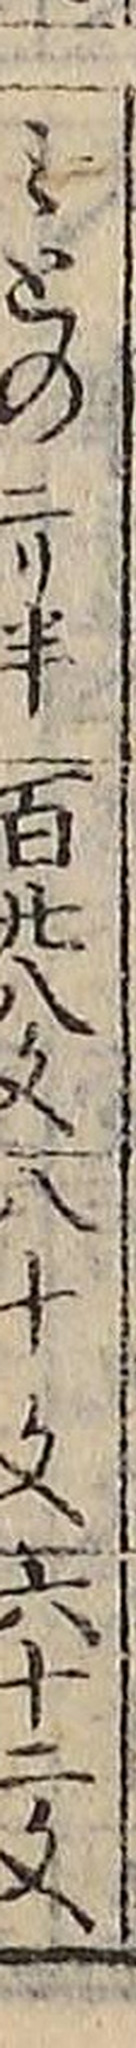みとの二リ半百廿八文八十文六十二文
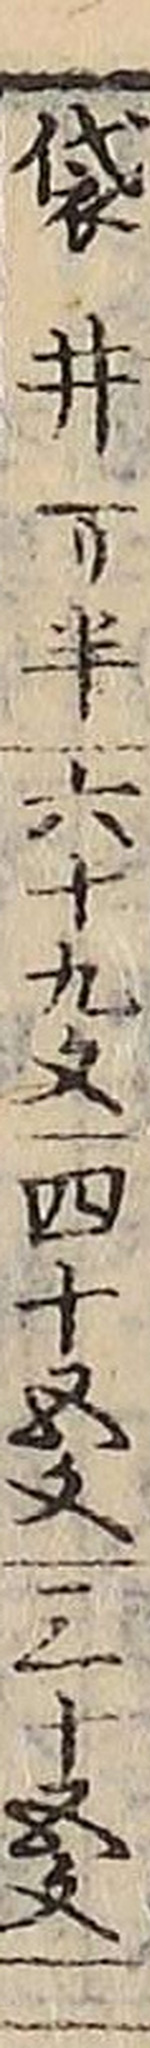袋井一リ半六十九文四十五文三十五文
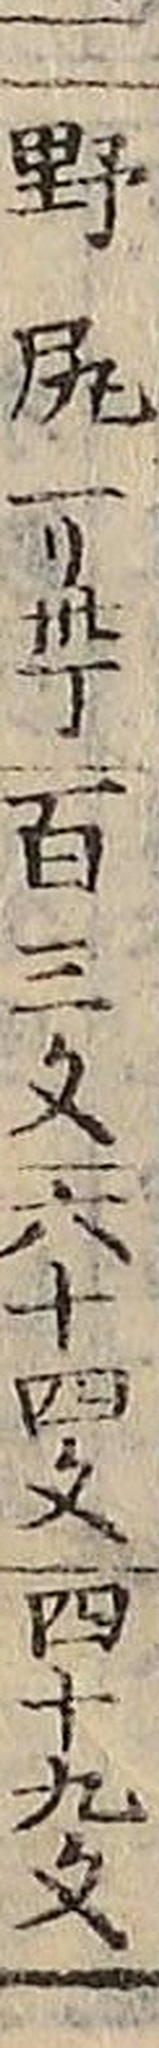野尻一リ卅丁百三文六十四文四十九文
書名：旅行用心集
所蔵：神戸大学附属図書館 国文学研究資料館
